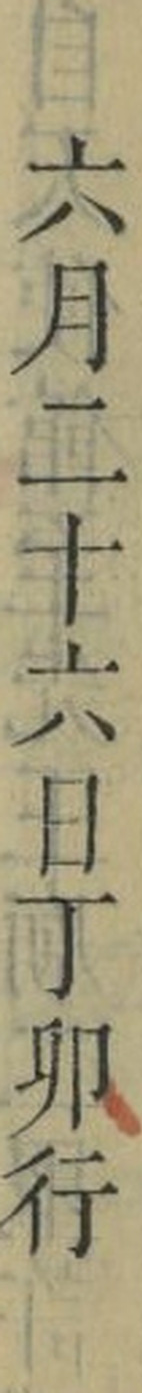六月二十六日丁卯行
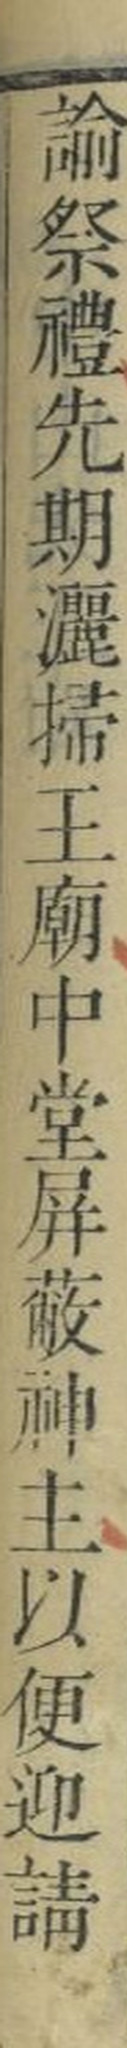諭祭禮先期灑掃王廟中堂屏蔽神主以更迎請
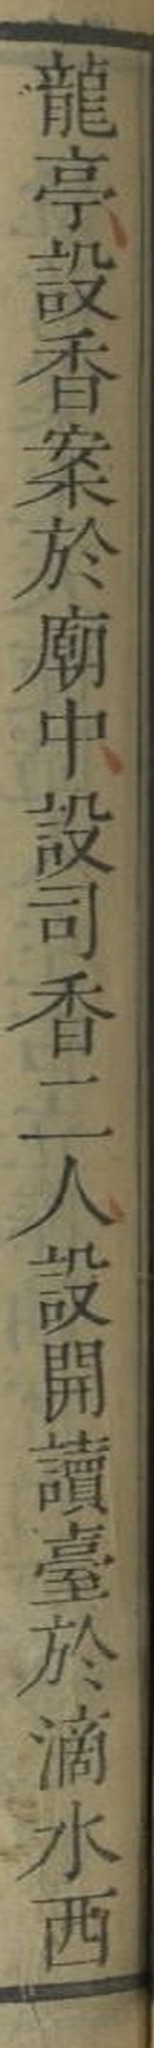龍亭設香案於廟中設司香二人設開讀臺於滴水西
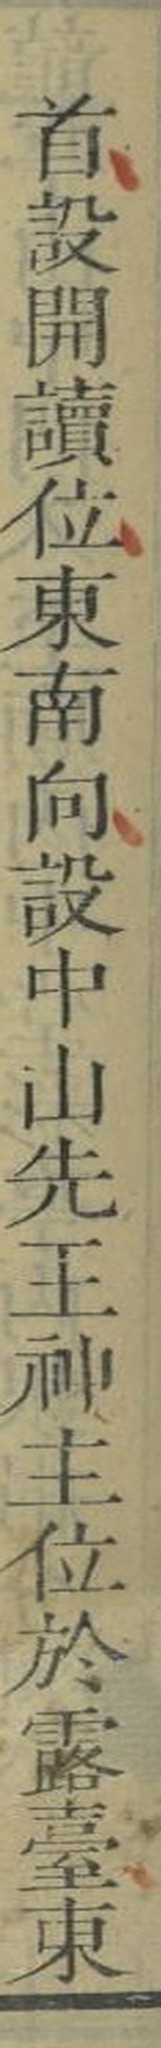首設開讀位東南向設中山先王神主位於露臺東
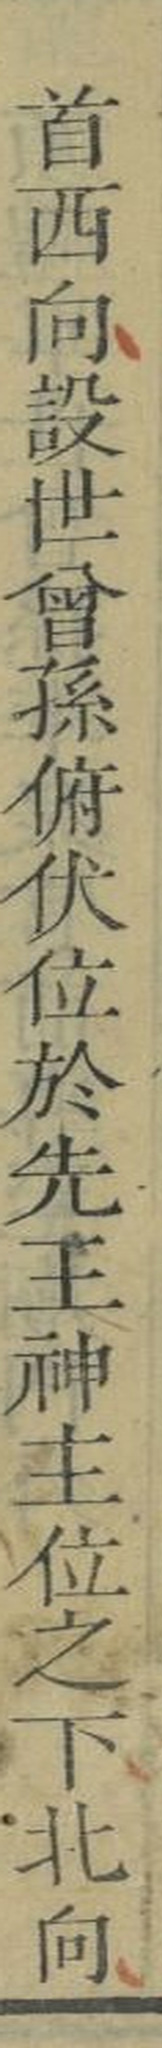首西向設世曾孫俯伏位於先王神主位之下北向
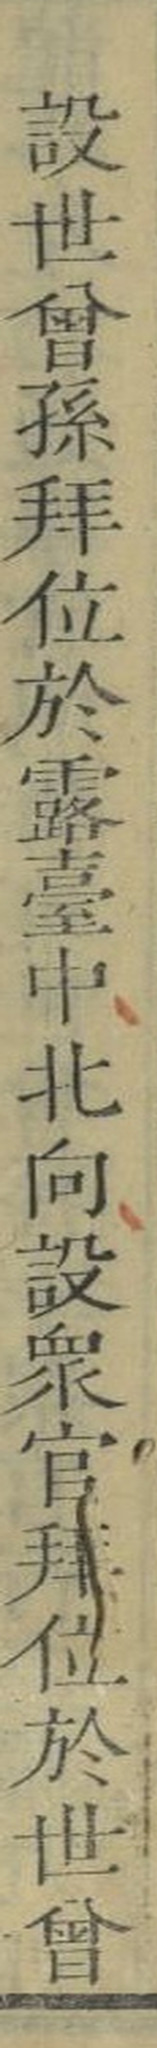設世曾孫拜位於露臺中北向設衆官拜位於世曾
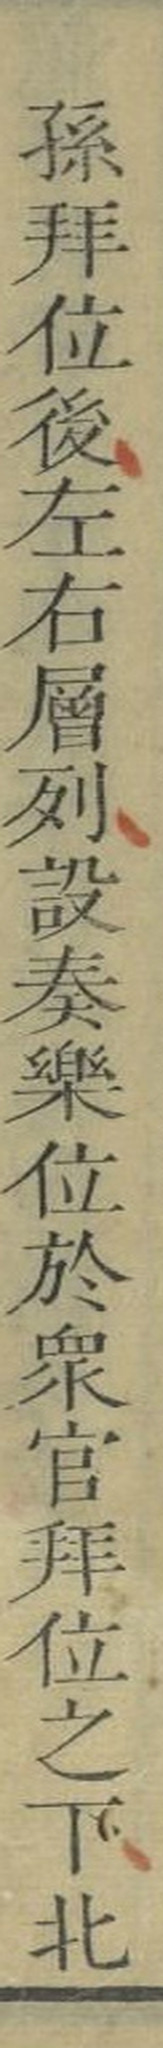孫拜位後左右層列設奏樂位於衆官拜位之下北
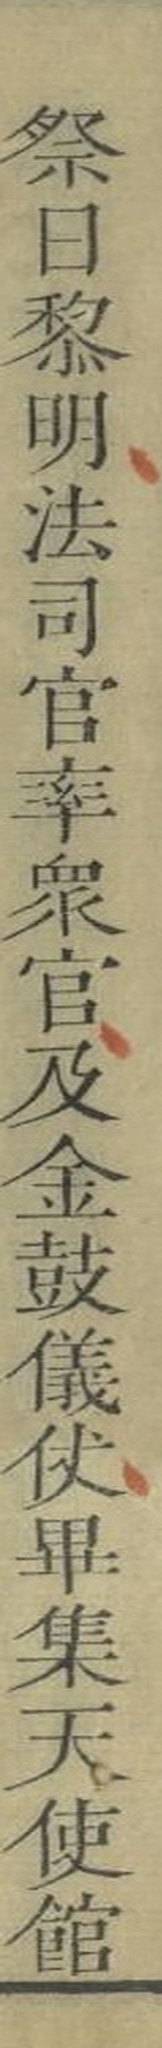祭日黎明法司官率衆官及金鼓儀仗畢集天使館
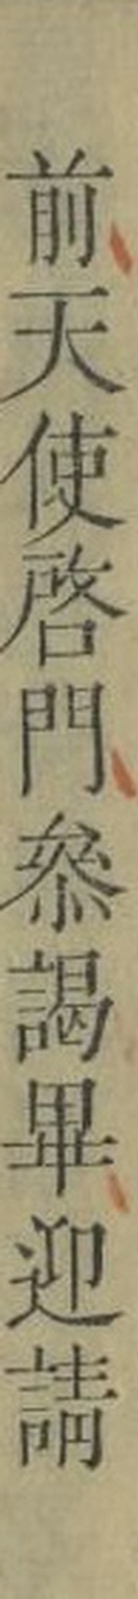前天使啓門叅謁畢迎請
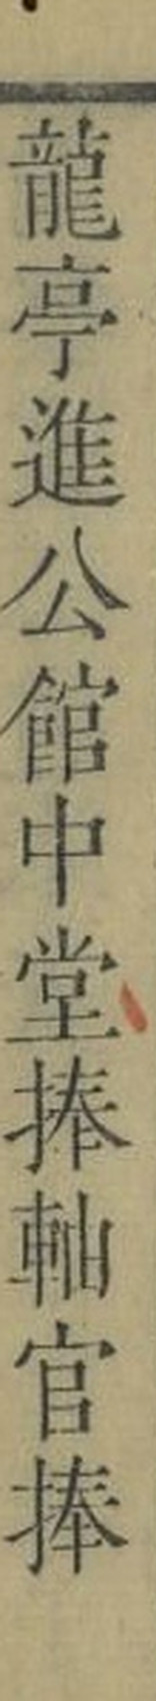龍亭進公館中堂捧軸官捧

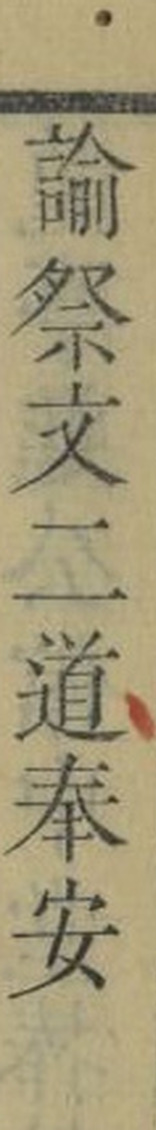諭祭文二道奉安
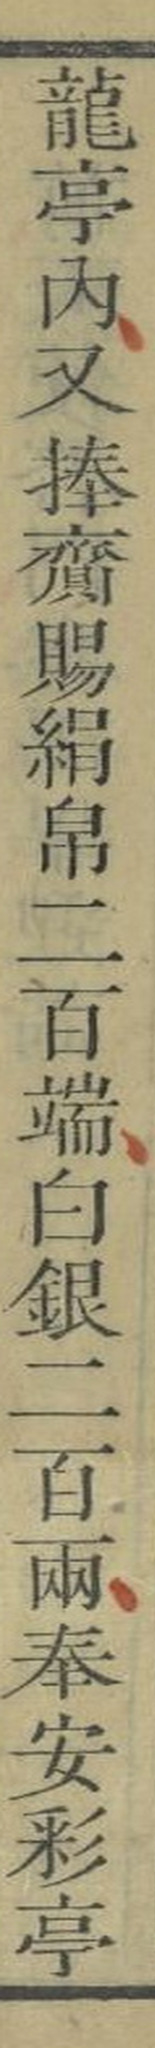龍亭内又捧齎賜絹帛二百端白銀二百兩奉安彩亭
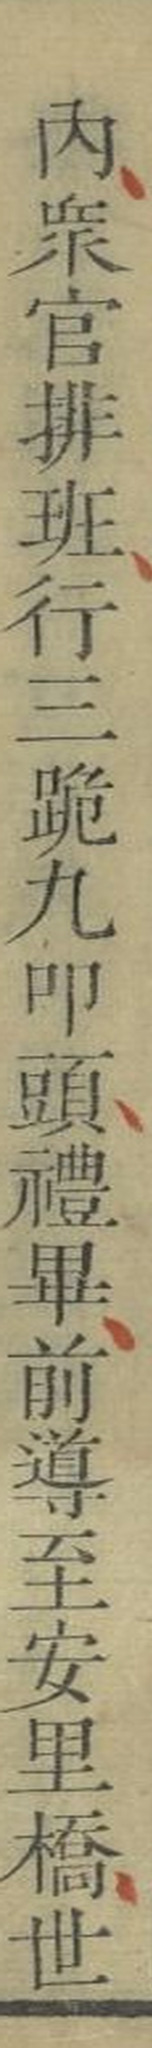内衆官排班行三跪九叩頭禮畢前導至安里橋世
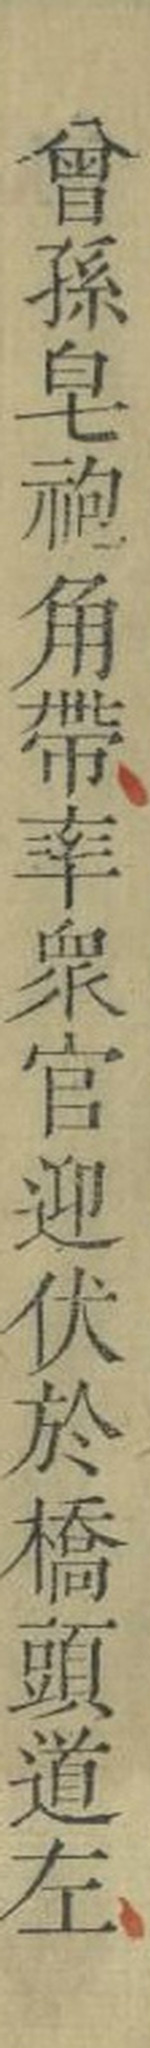曾孫皂袍角帶率衆官迎伏於橋頭道左
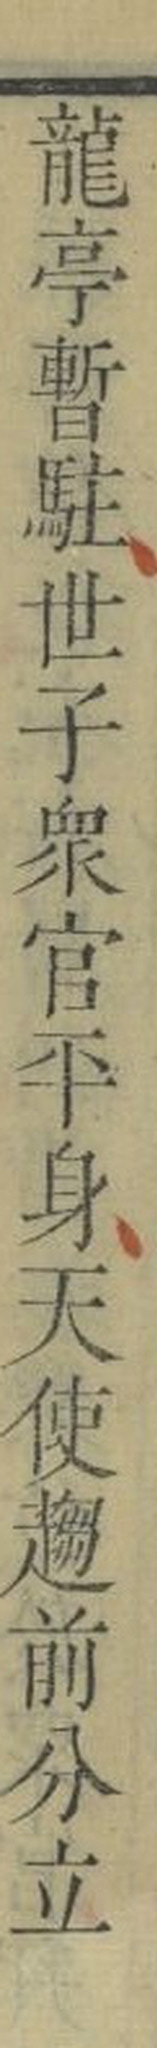龍亭暫駐世子衆官平身天使趨前分立
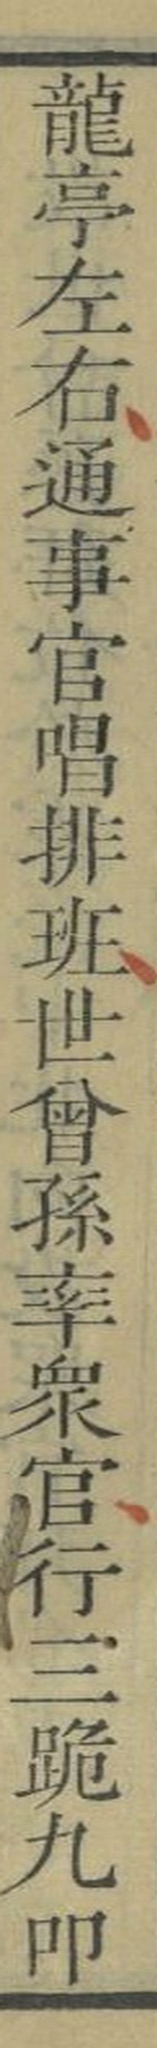龍亭左右通事官唱排班世曾孫率衆官行三跪九叩
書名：中山伝信録 巻一、巻二
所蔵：University of the Ryukyus Library
